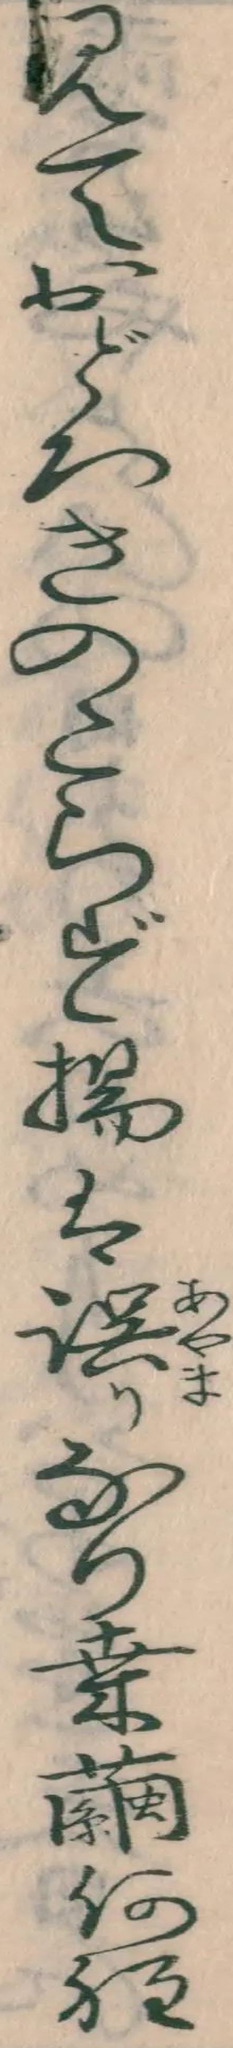見ておどろきのこらず揚は誤りなり桑繭何程
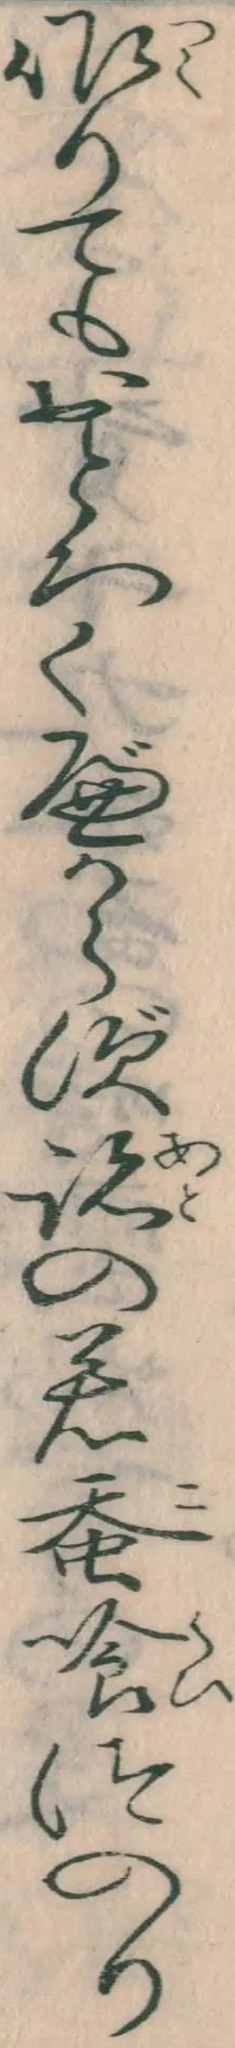作りてもおとろくべからず跡の若蚕喰つのり
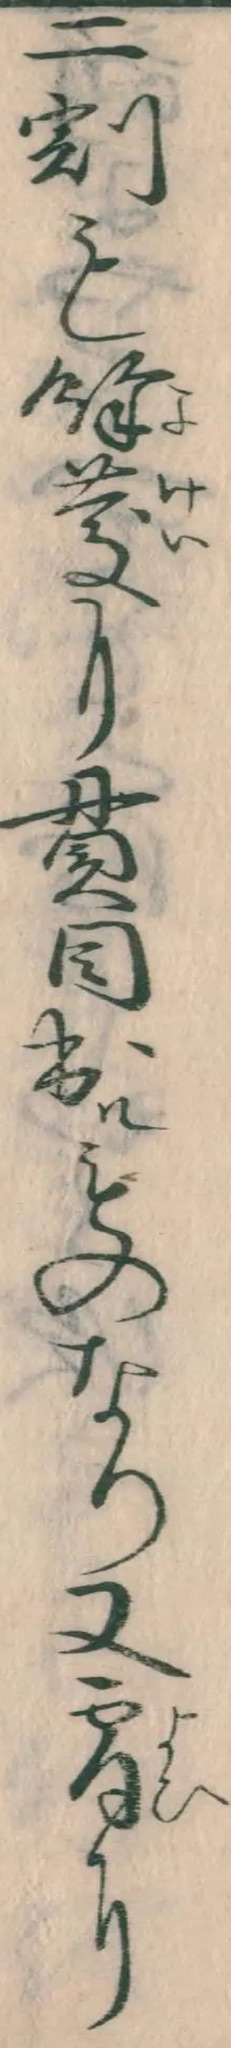二割も余慶に貫目出るものなり又宵に
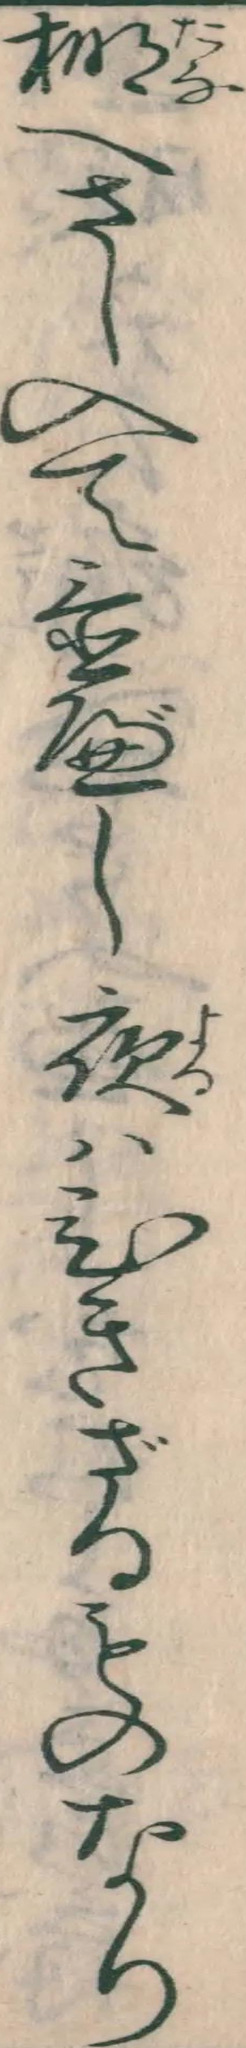棚へさし入て置べし夜はひきざるものなり
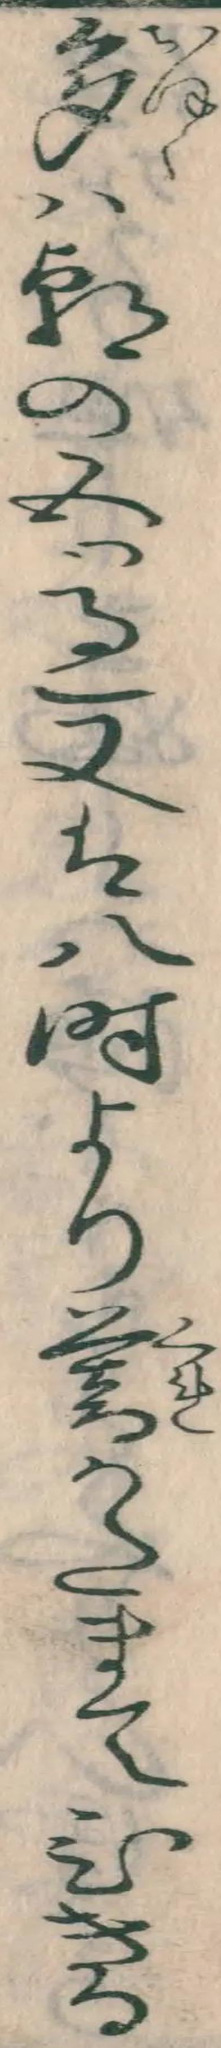多は朝の五ツ過又は八時より暮かたまてひきる
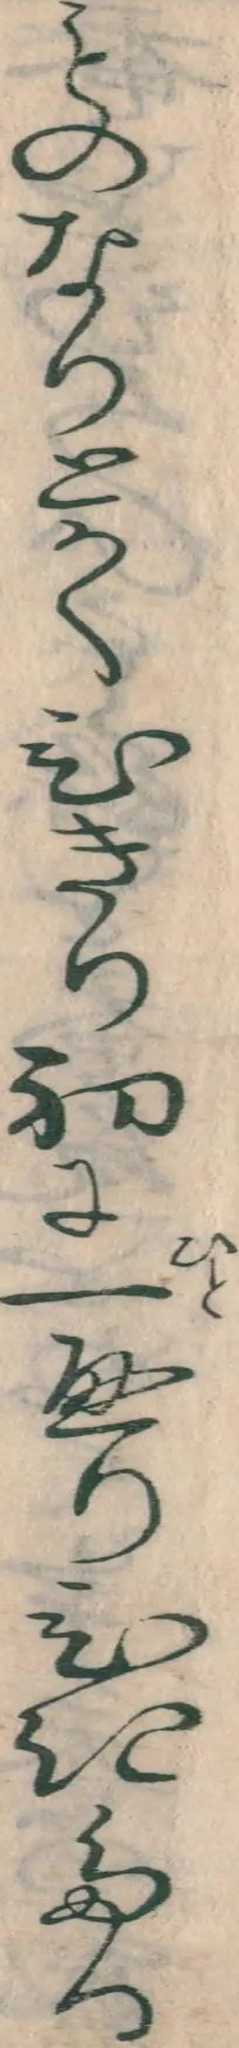ものなりとかくひきり初に一通りひきたる

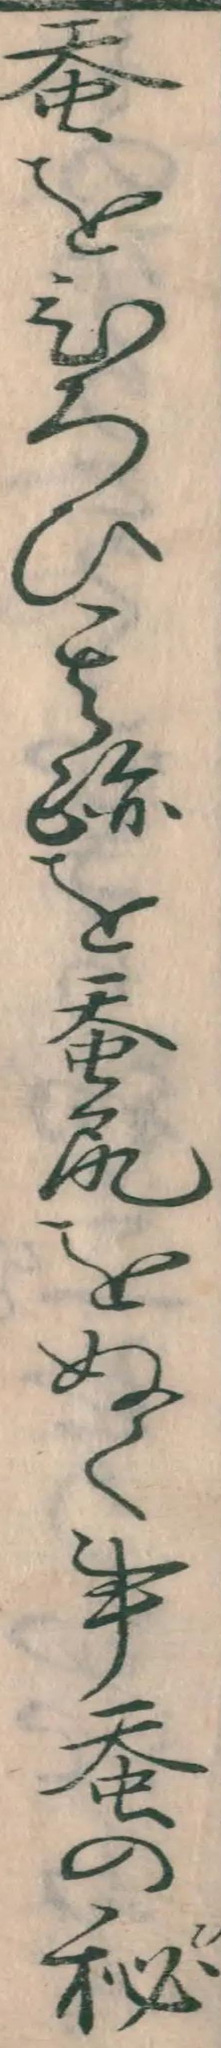蚕をひろひ其跡を蚕尻をぬく事蚕の秘
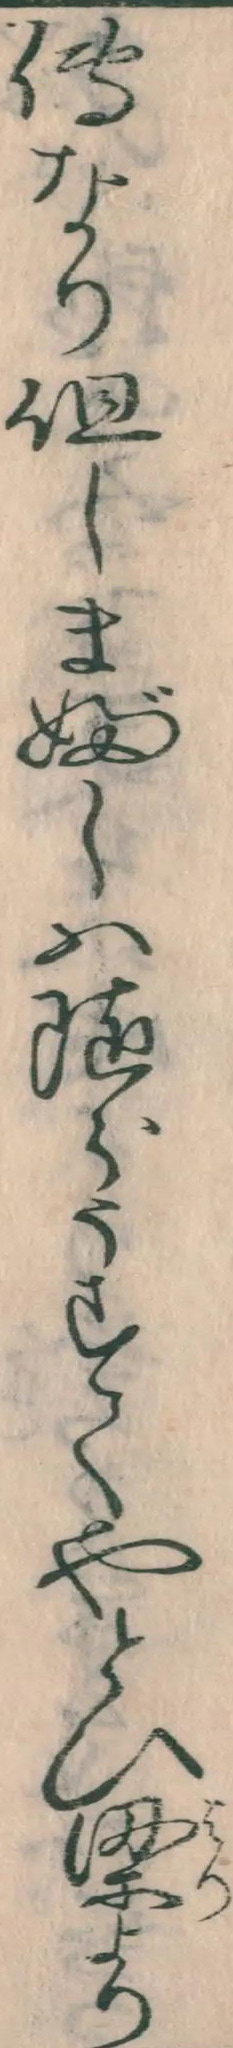伝なり但しまぶしは随分うすくやとひ梁より
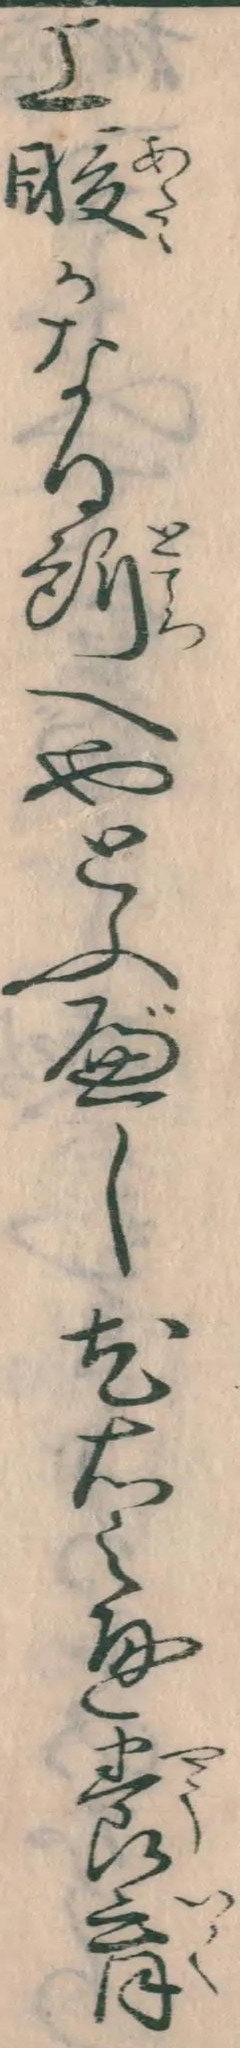上暖かなる所へやとふべし尤右之通養育
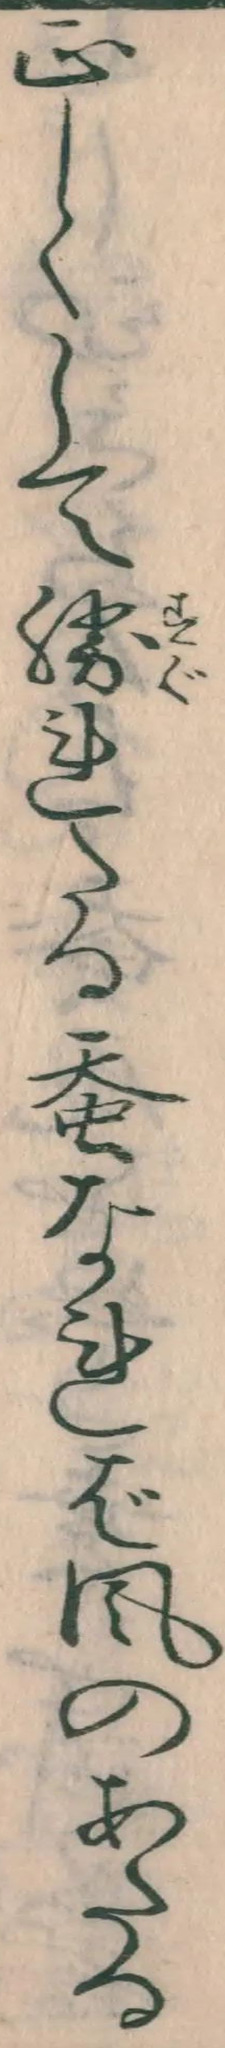正しくして勝れたる蚕なれば風のあたる
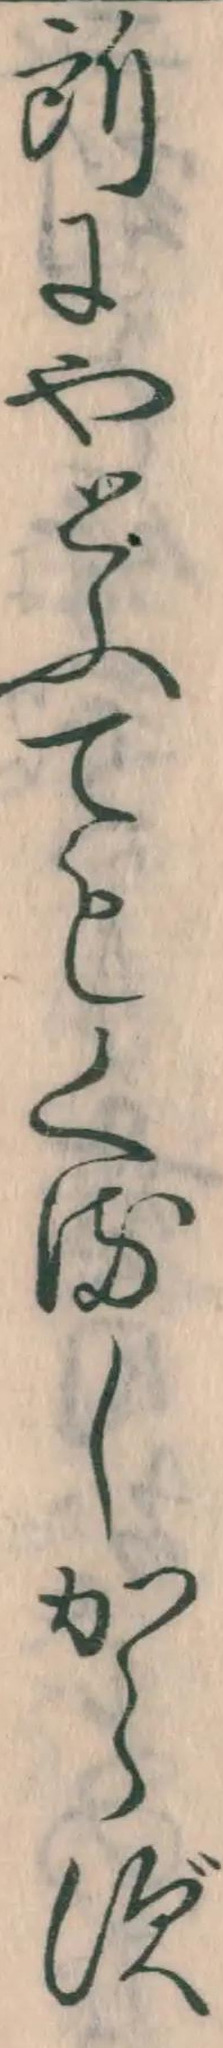所にやとふてもくるしからず
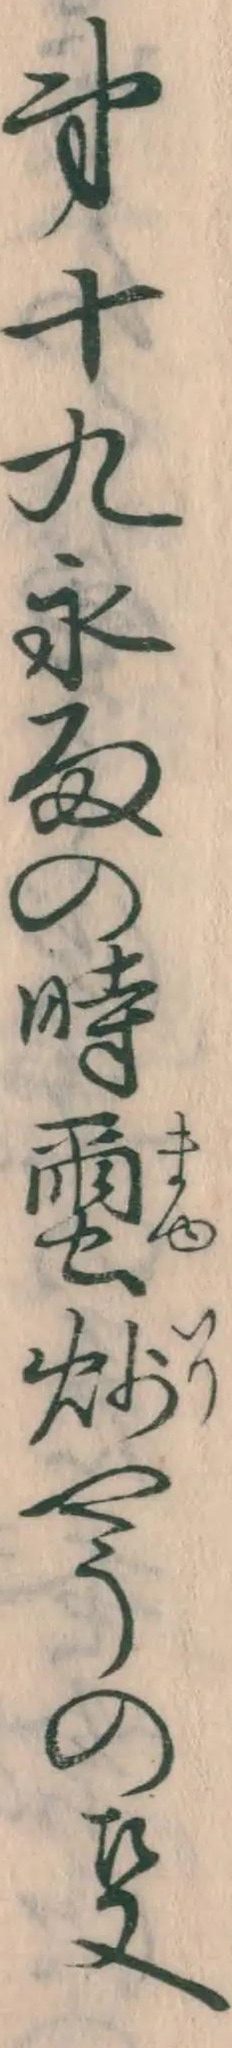第十九永雨の時繭炒やうの事
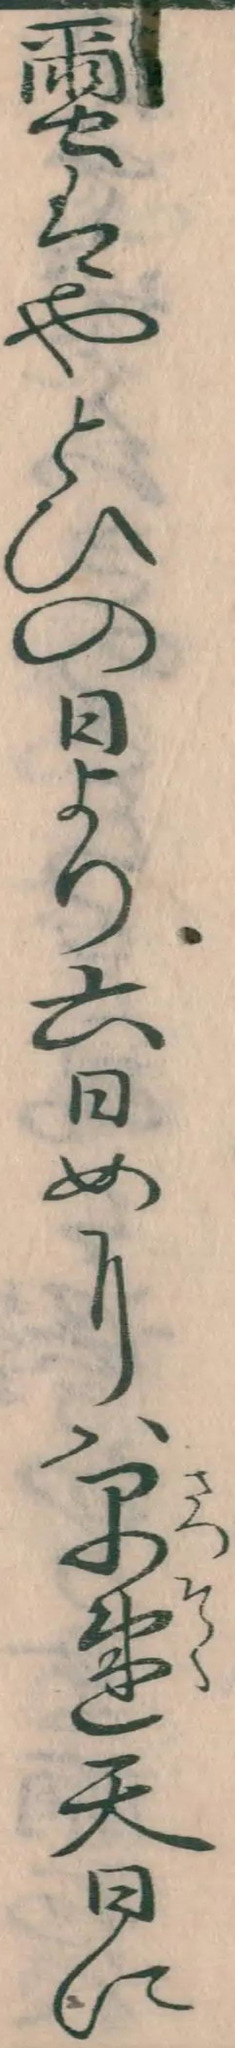繭はやとひの日より六日めには早速天日に
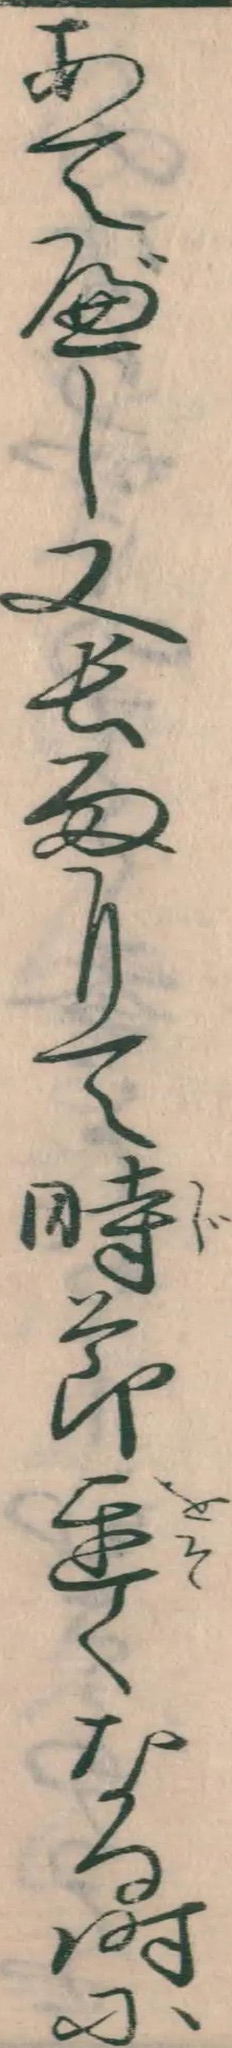あてべし又長雨にて時節遅くなる時に
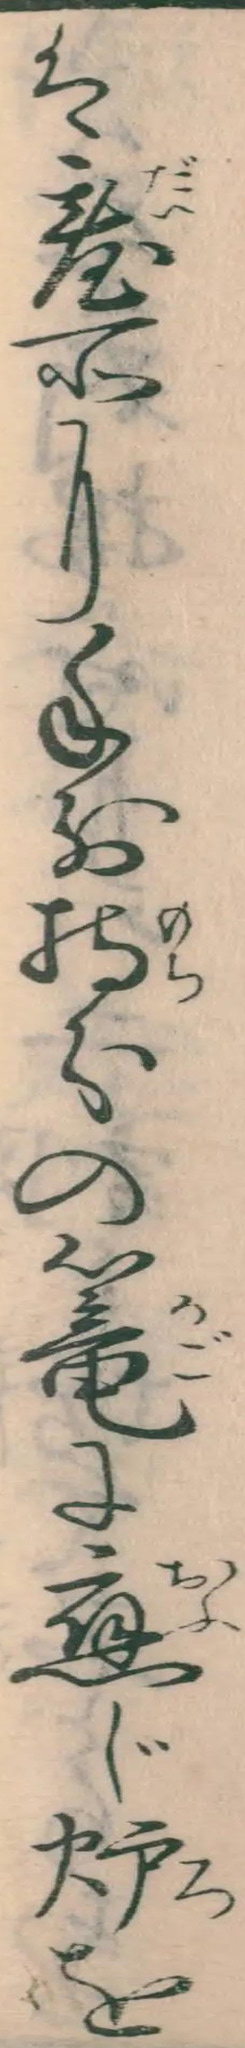は台所に手前持分の篭に応じ炉を
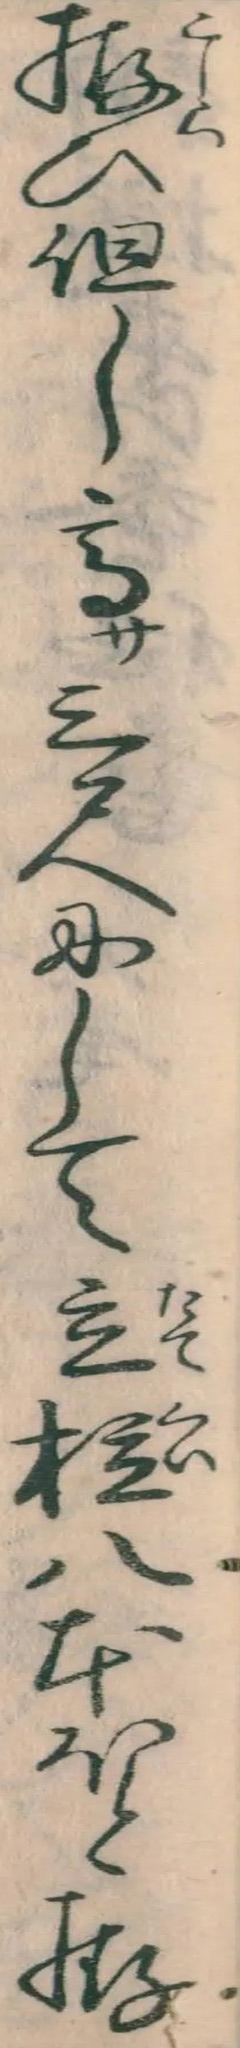拵ひ但し高さ三尺にし立柱八本ほと拵
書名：新撰養蚕秘書
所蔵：国立国会図書館 National Diet Library, JAPAN
